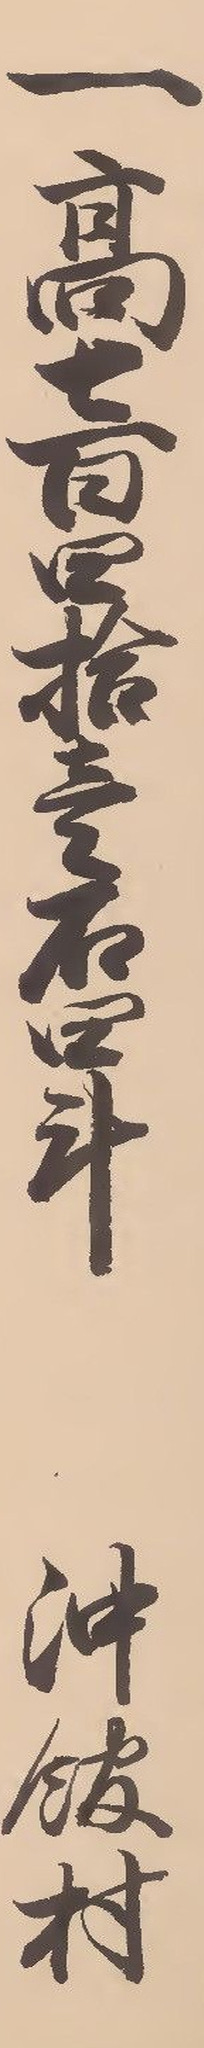一高七百四拾壱石四斗沖館村
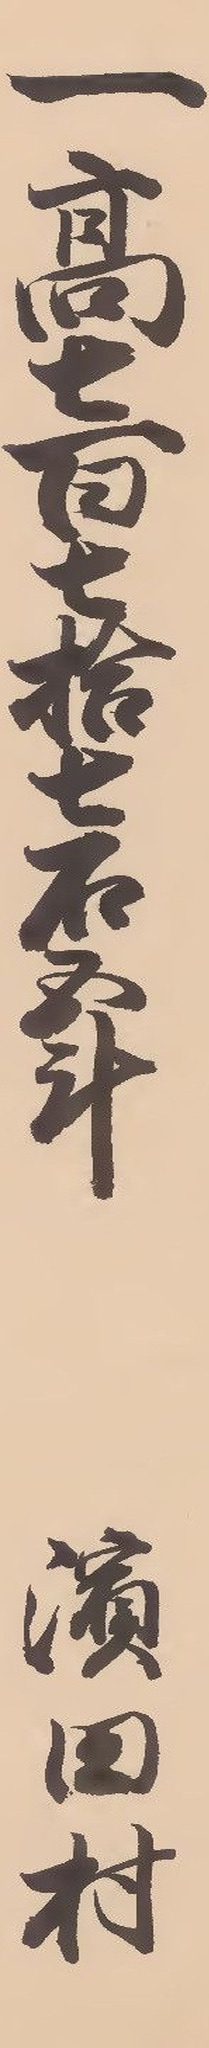一高七百七拾七石五斗浜田村
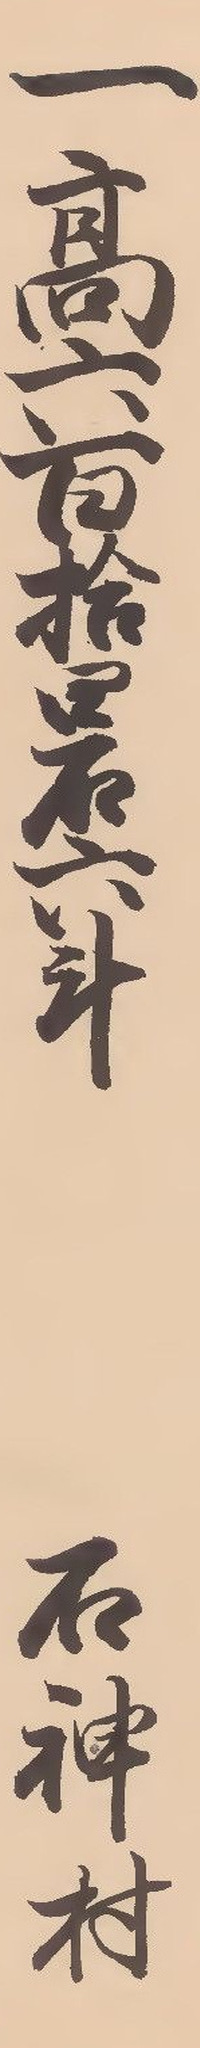一高六百拾四石六斗石神村
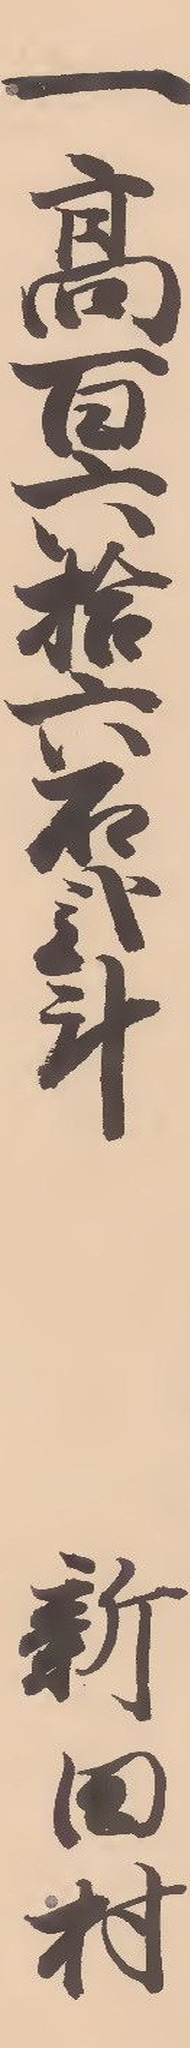一高百六拾六石弐斗新田村

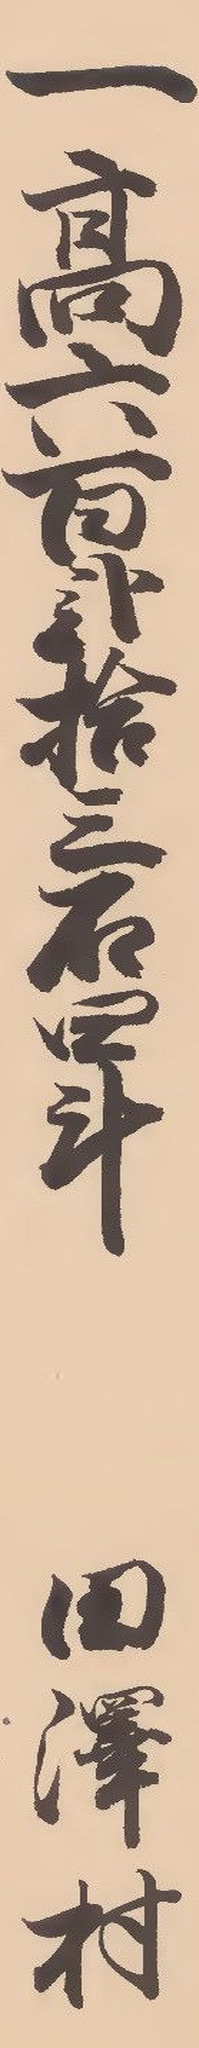一高六百弐拾三石四斗田沢村
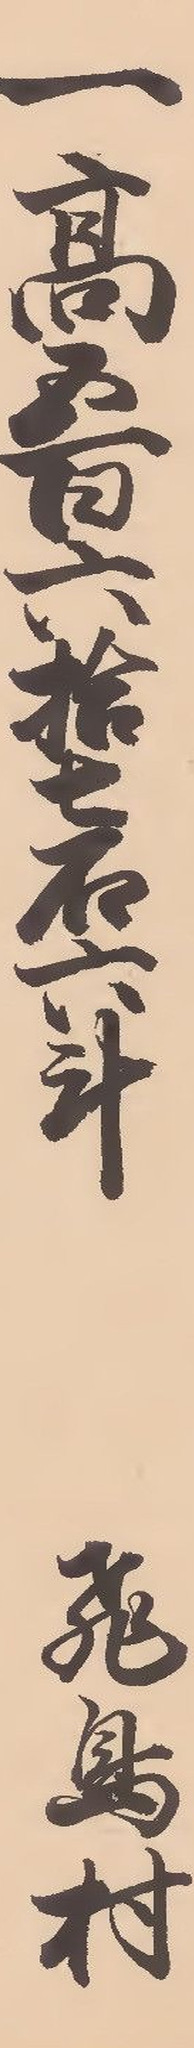一高五百六拾七石六斗飛鳥村
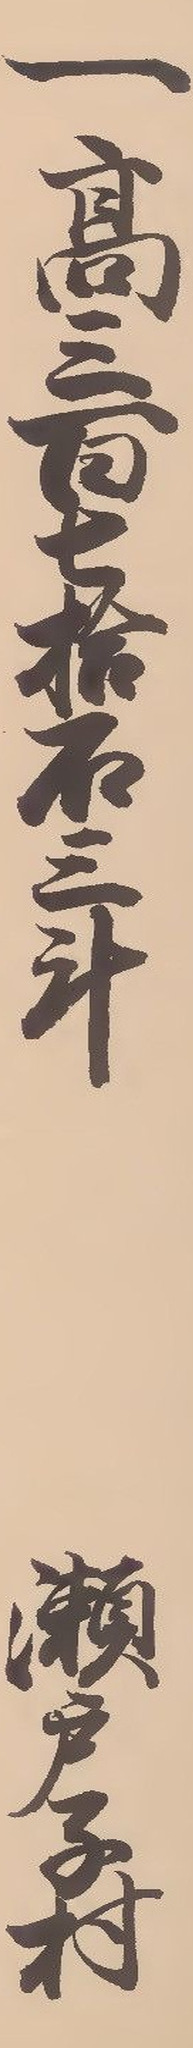一高三百七拾石三斗瀬戸子村
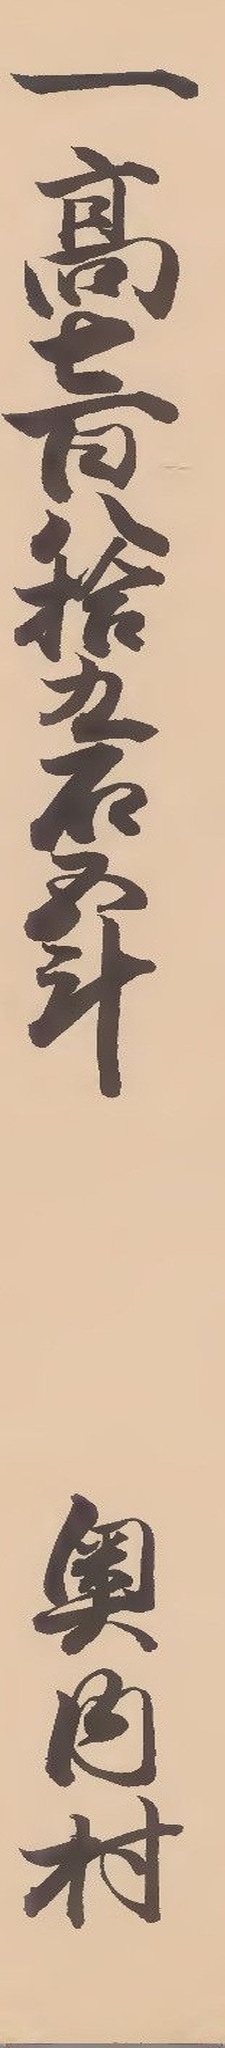一高七百八拾九石五斗奥内村
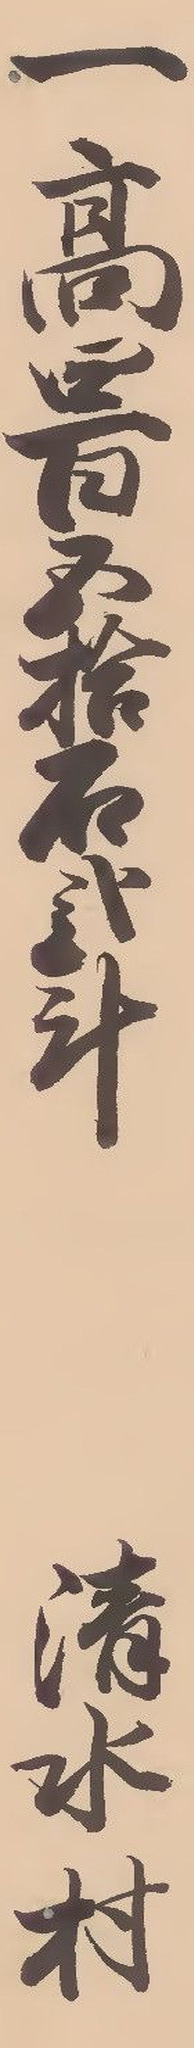一高四百五拾石弐斗清水村

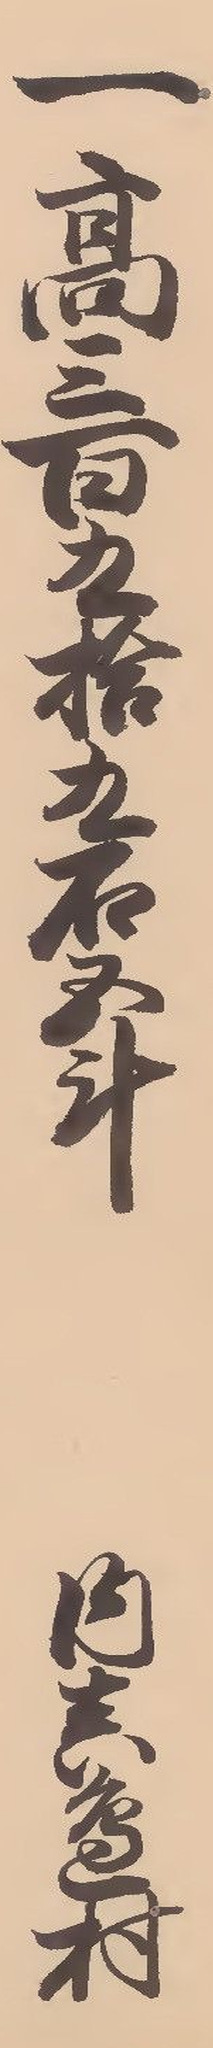一高三百九拾九石五斗内真辺村
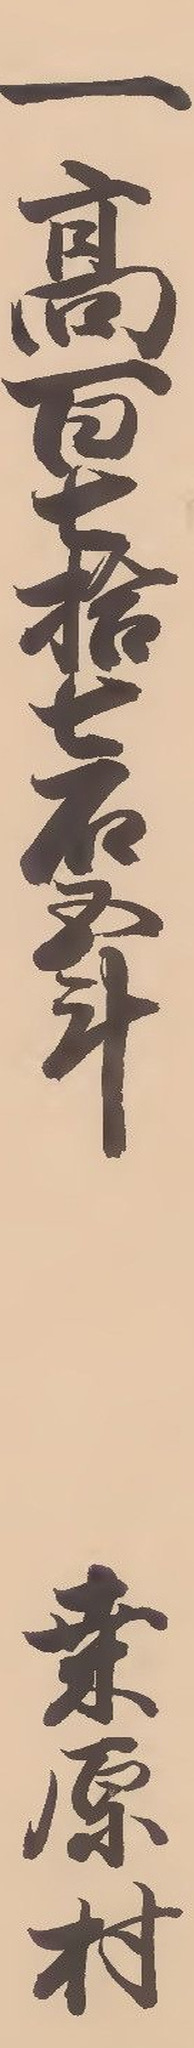一高百七拾七石五斗桑原村
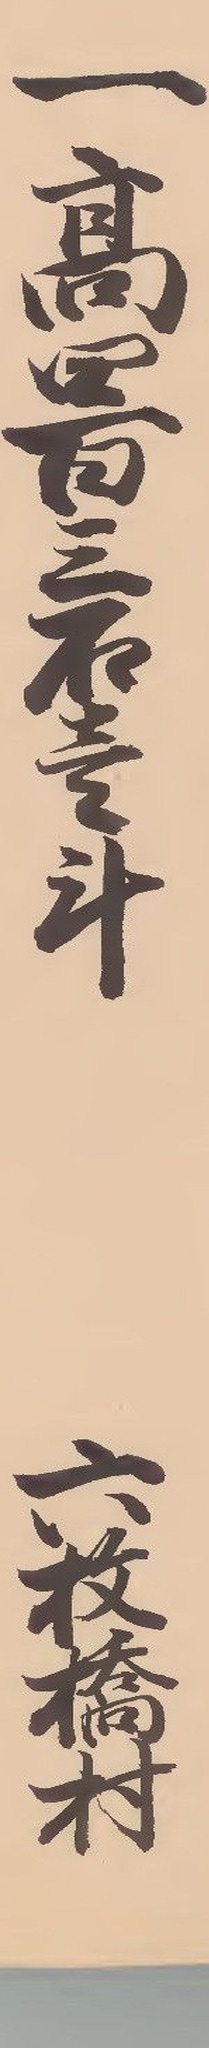一高四百三石壱斗六枚橋村
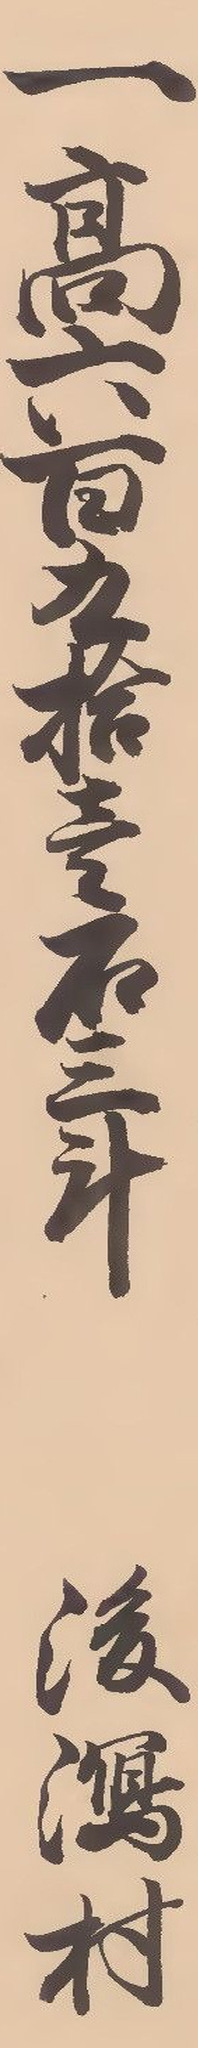一高六百九拾壱石三斗後潟村
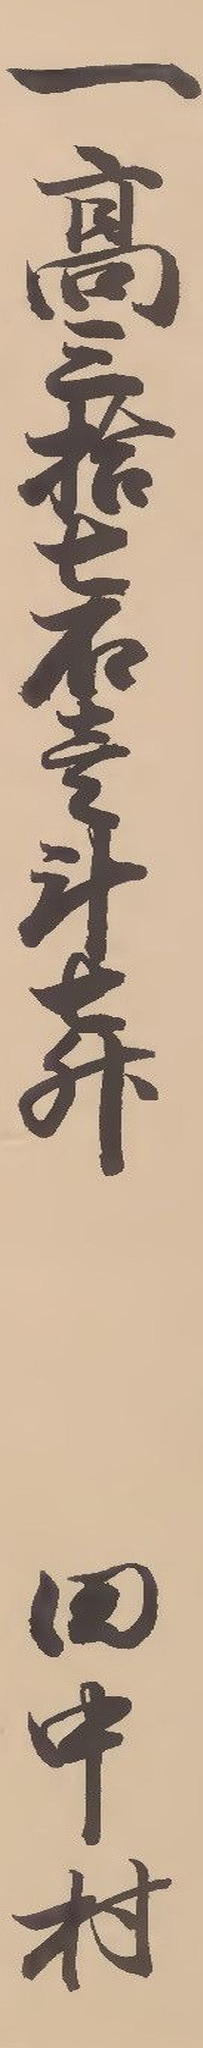一高三拾七石壱斗七升田中村
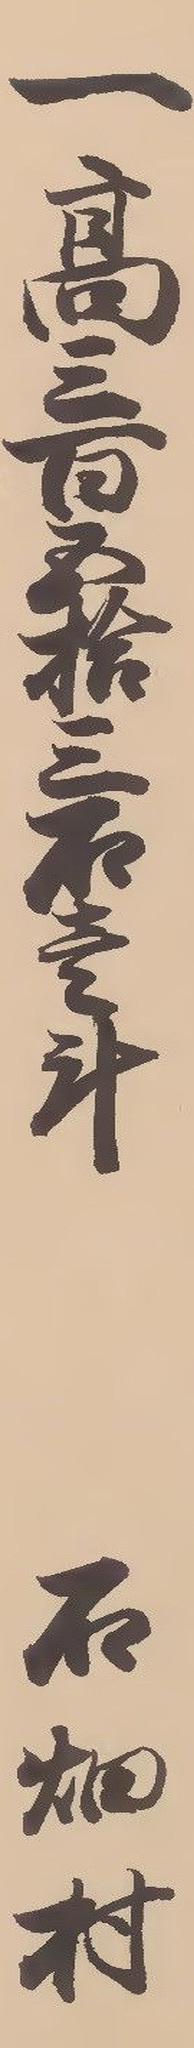一高三百五拾三石壱斗石畑村

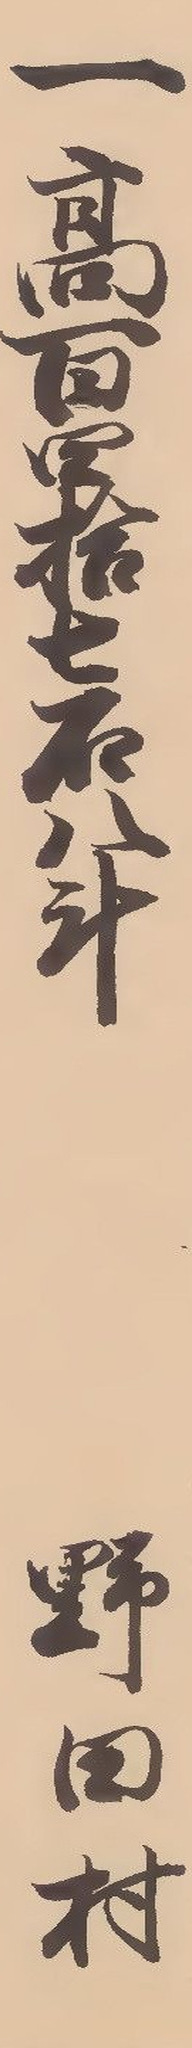一高百四拾七石八斗野田村
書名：陸奥国郷帳　７
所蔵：国立公文書館 National Archives of Japan
